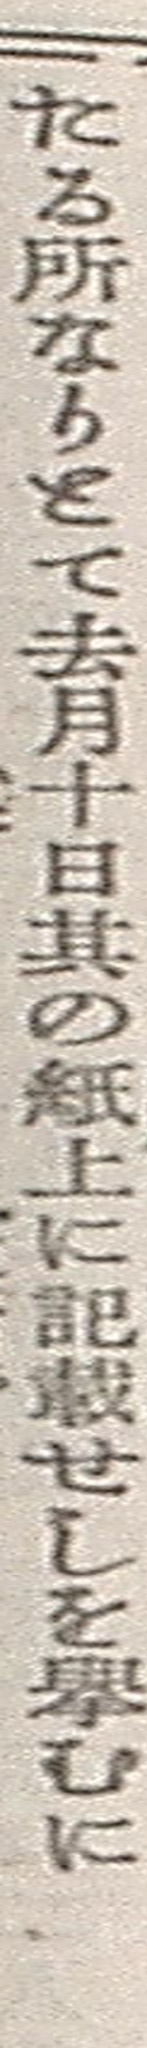たる所なりとて去月十日其の紙上に記載せしを挙むに
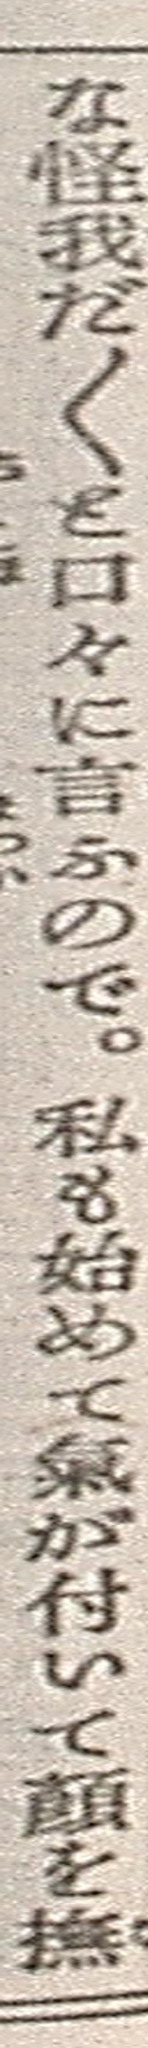な怪我だ〳〵と口々に言ふので。私も始めて気が付いて顔を撫
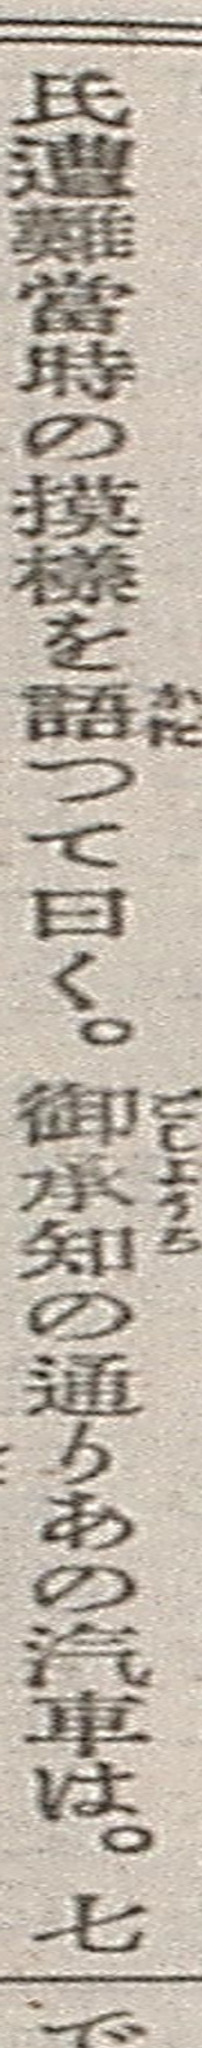氏遭難当時の模様を語つて曰く。御承知の通りあの汽車は。七
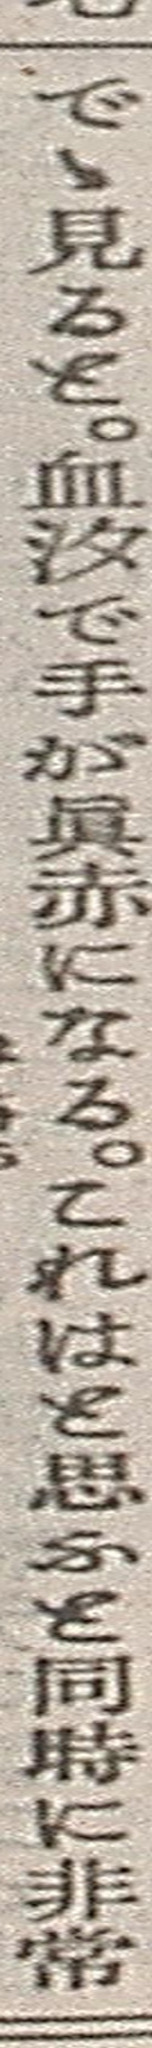でゝ見ると。血汐で手が真赤になる。これはと思ふと同時に非常
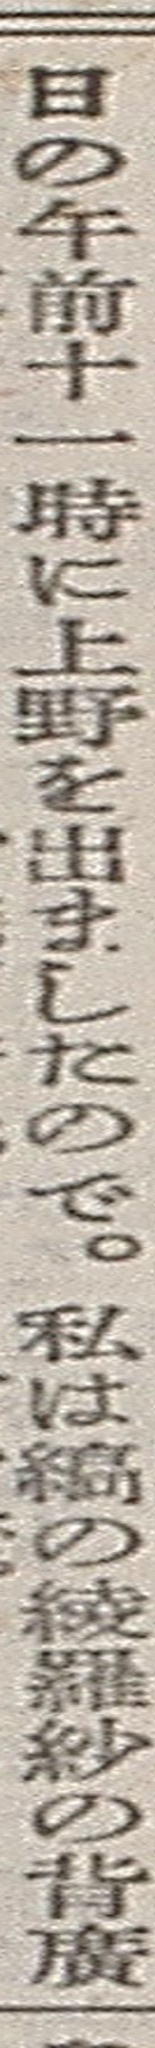日の午前十一時に上野を出ましたので。私は縞の綾羅紗の背広
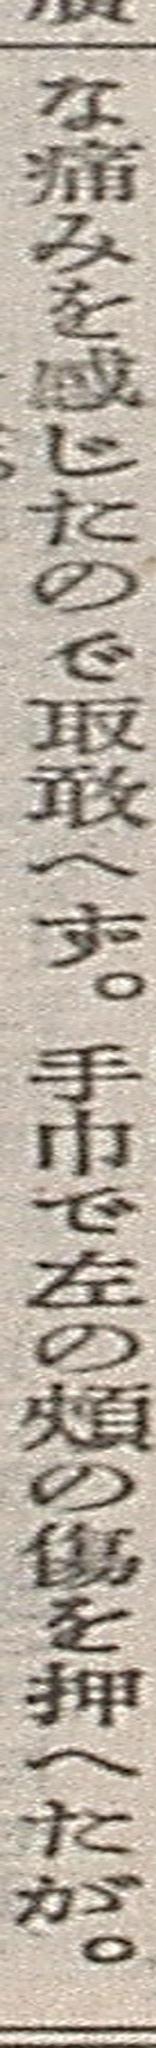な痛みを感じたので取敢へず。半巾で左の頬の傷を押へたが。
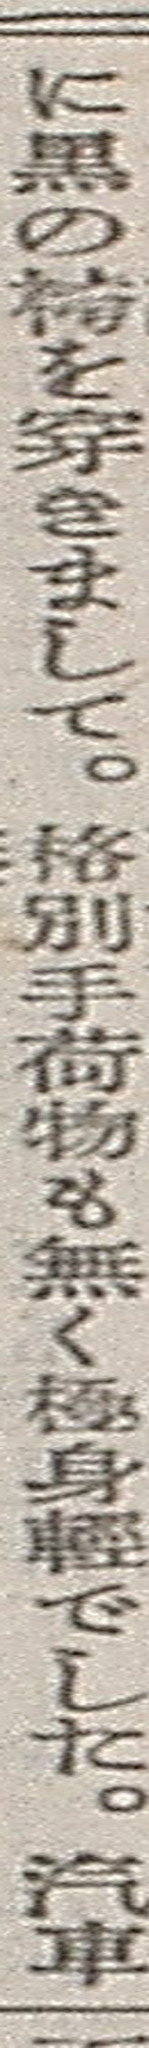に黒の袴を穿きまして。格別手荷物も無く極身軽でした。汽車
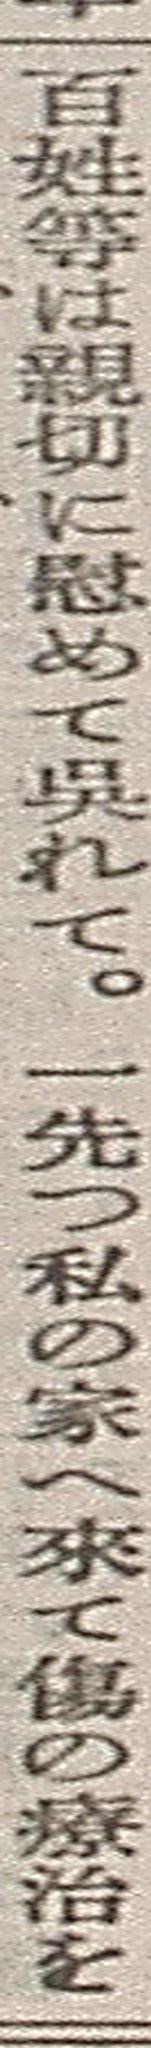百姓等は親切に慰めて呉れて。一先つ私の家へ来て傷の療治を
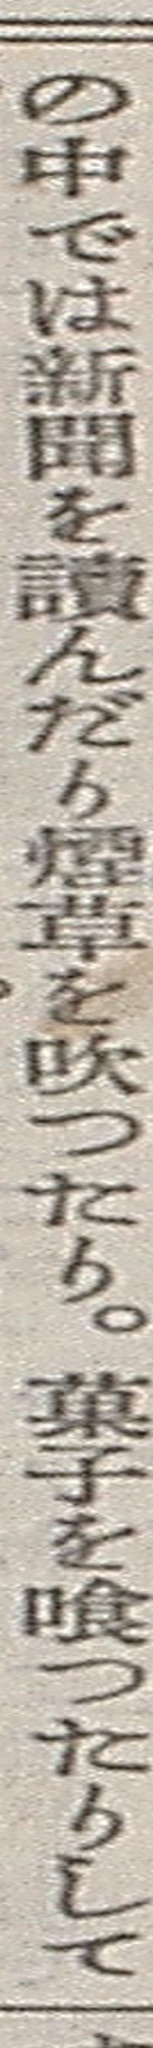の中では新聞を読んだり煙草を吹つたり。菓子を喰つたりして
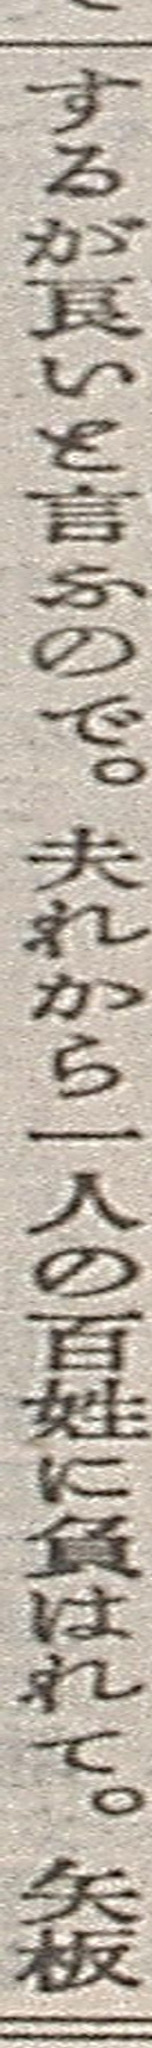するが良いと言ふので。夫れから一人の百姓に負はれて。矢板
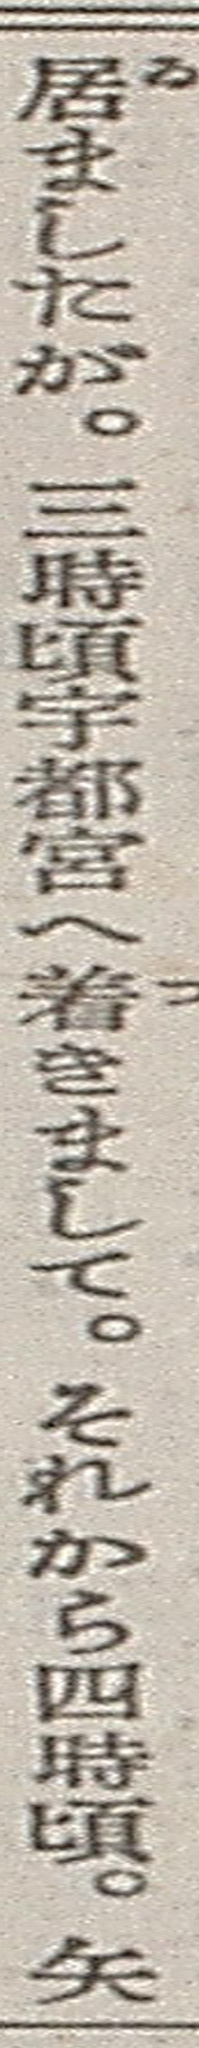居ましたが。三時頃宇都宮へ着きまして。それから四時頃。矢
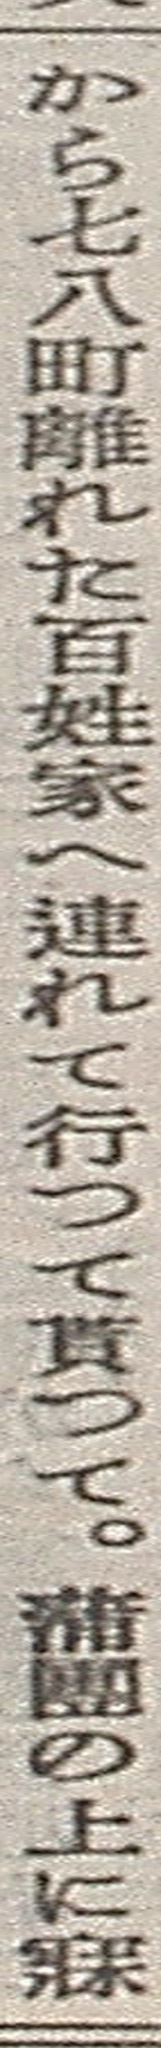から七八町離れた百性家へ連れて行つて貰つて。蒲団の上に寝
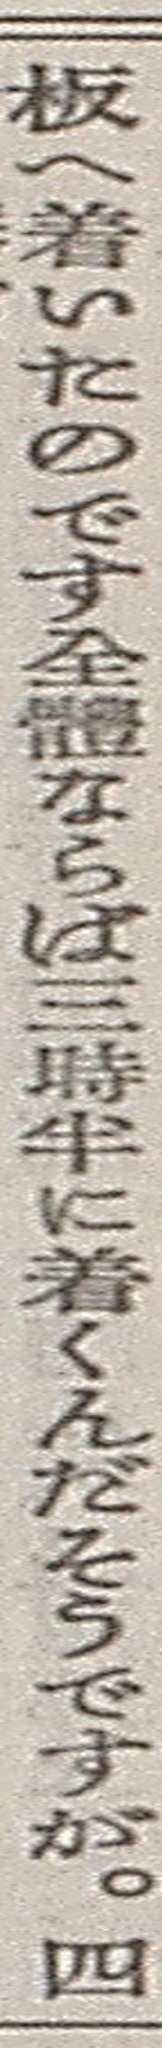板へ着いたのです全体ならば三時半に着くんだそうですが。四
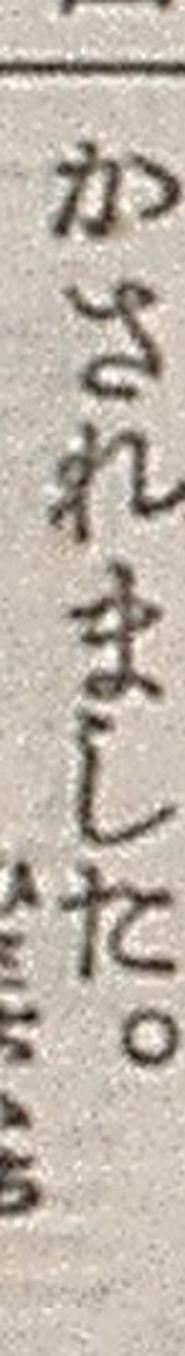かされました。
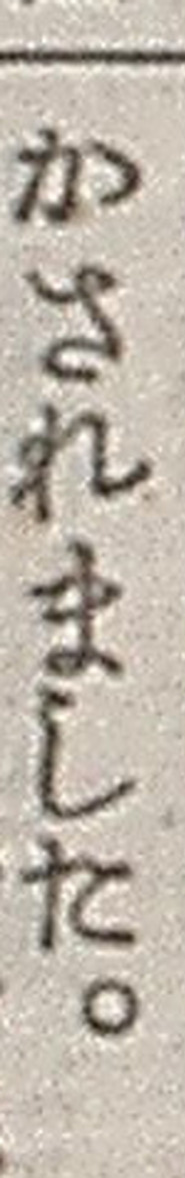かされました。
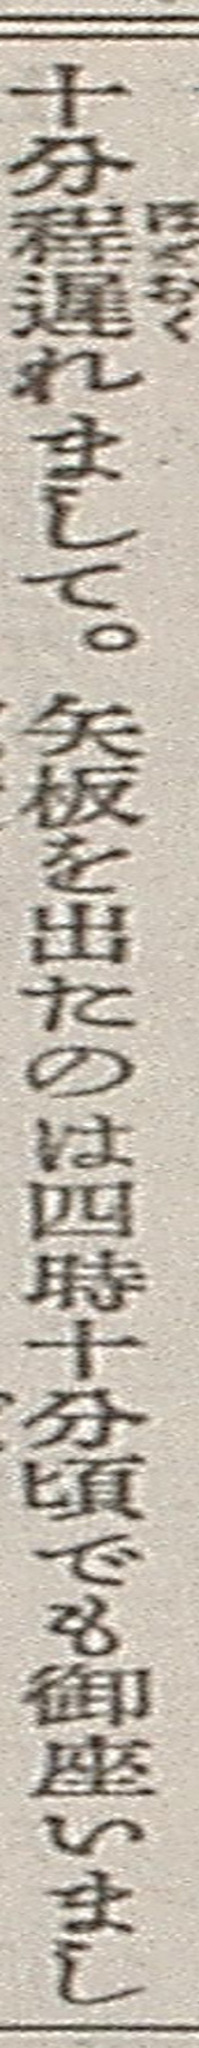十分程遅れまして。矢板を出たのは四時十分頃でも御座いまし
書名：風俗畫報臨時増刊第百九十九號　明治三十二年十月各地災害圖會（前編之續）
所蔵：東京大学地震研究所図書室 Earthquake Research Institute Library, The University of Tokyo, JAPAN
